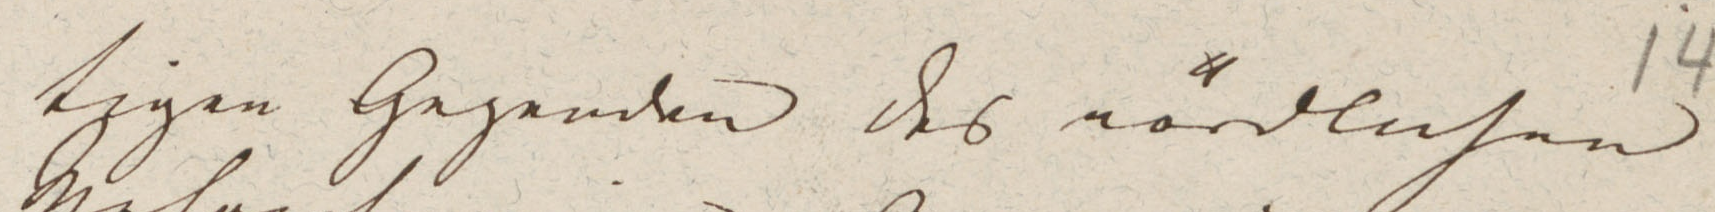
tigen Gegenden des nördlichen
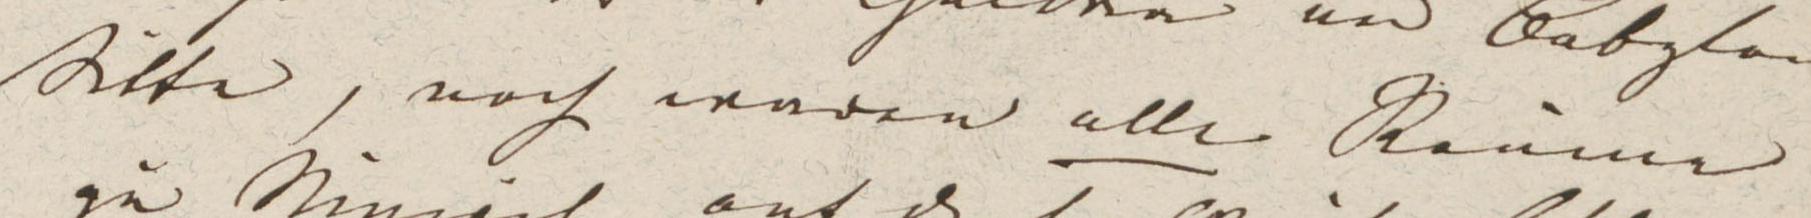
Sitte, noch waren alle Räume
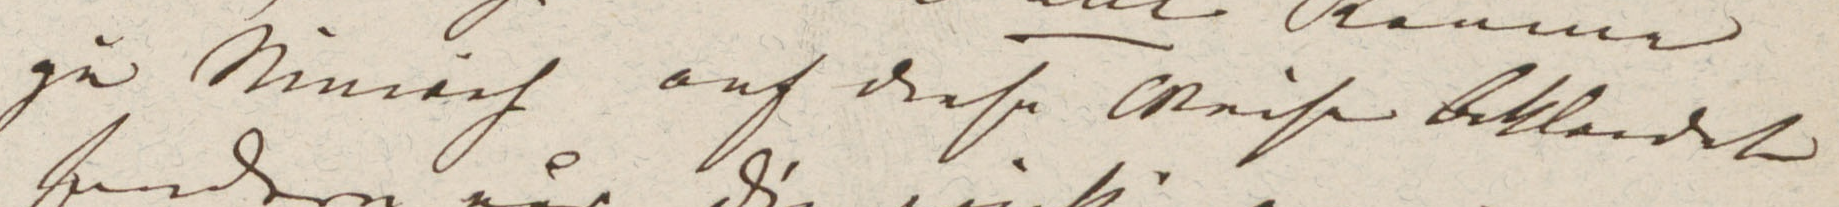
zu Niniveh auf diese Weise bekleidet
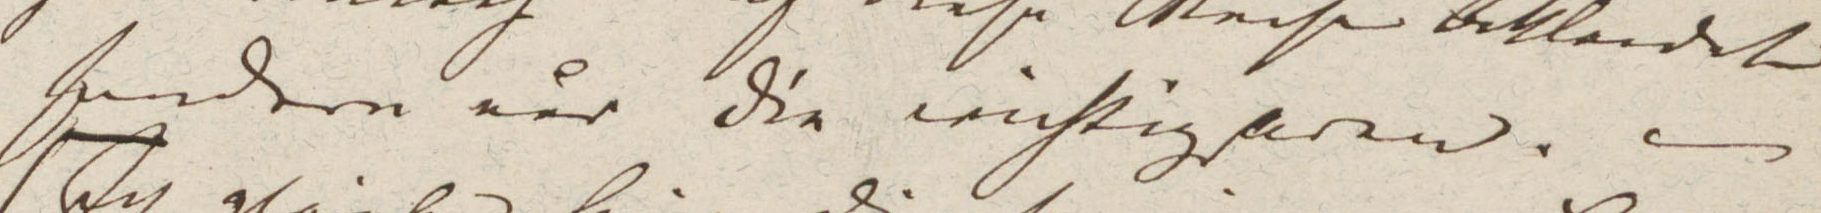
sondern nur die wichtigseren. –
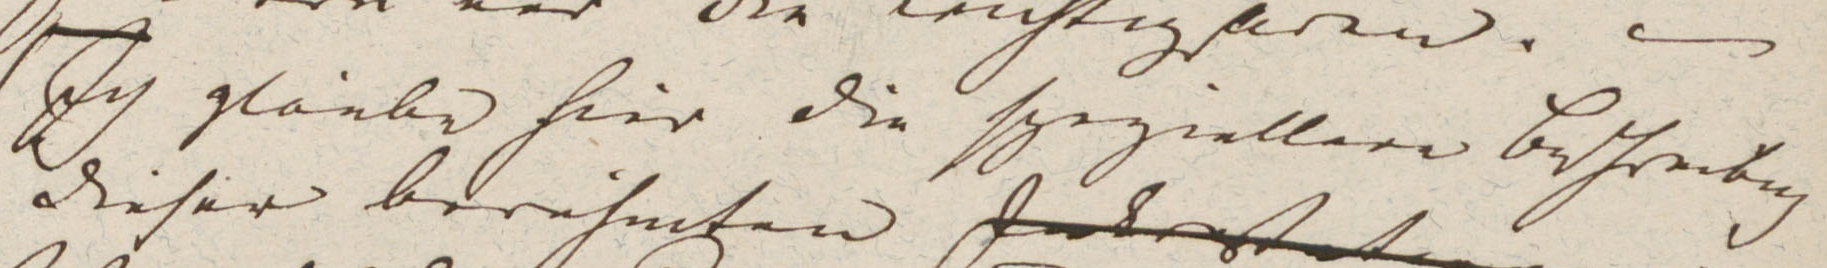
% Ich glaube hier die speziellere Beschreibung
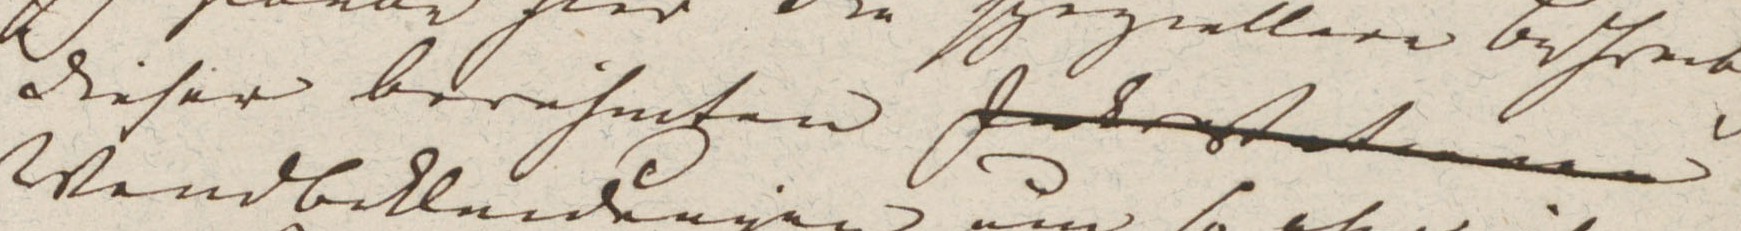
dieser berühmten Inkrustationen
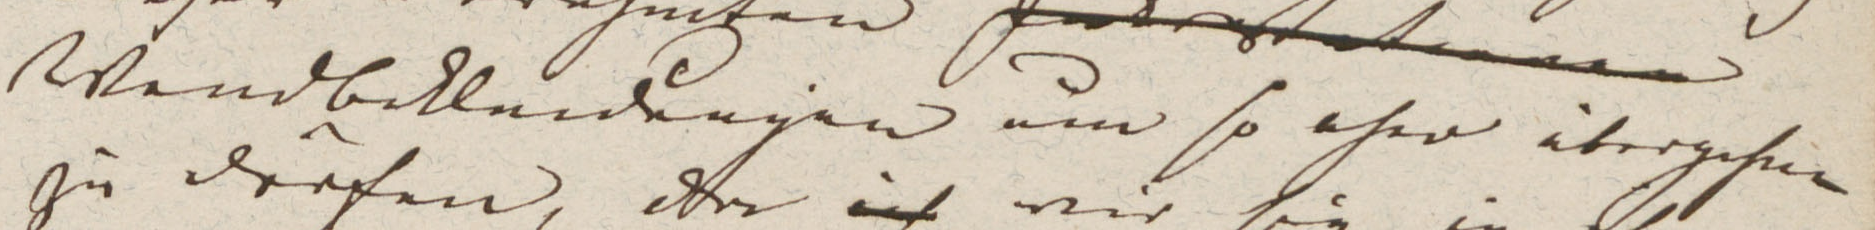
Wandbekleidungen um so eher übergehen
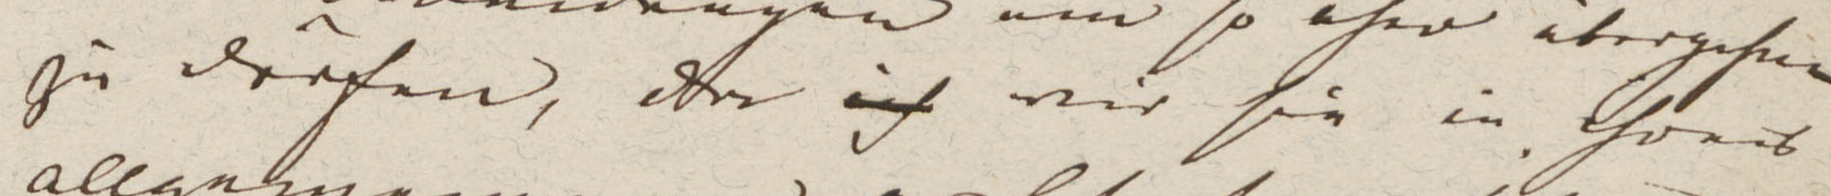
zu dürfen, da ich wir sie in ihres
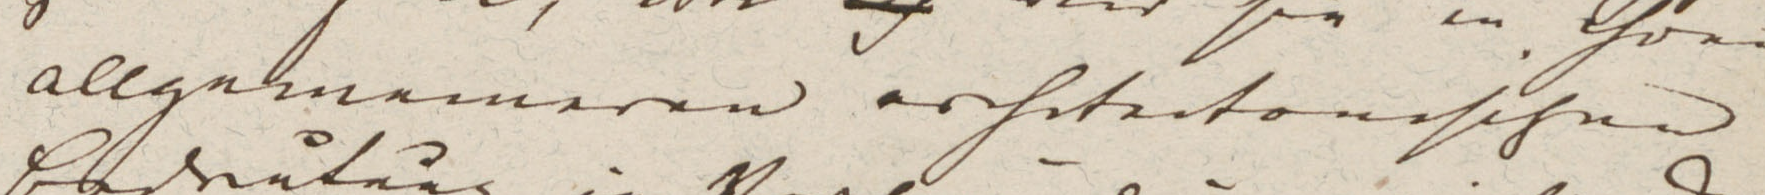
allgemeineren architectonischen
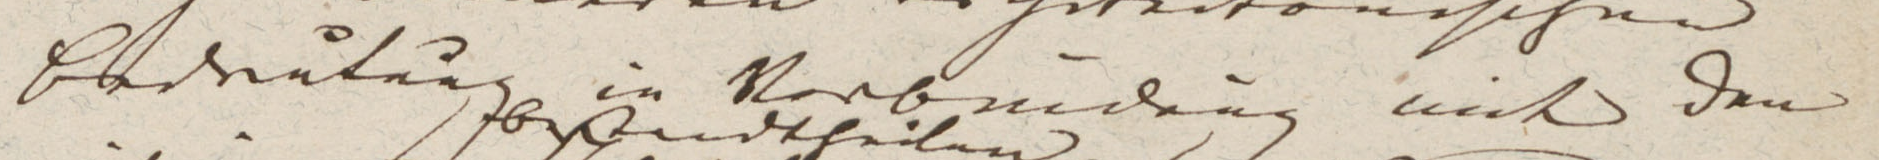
Bedeutung in Verbindung mit den
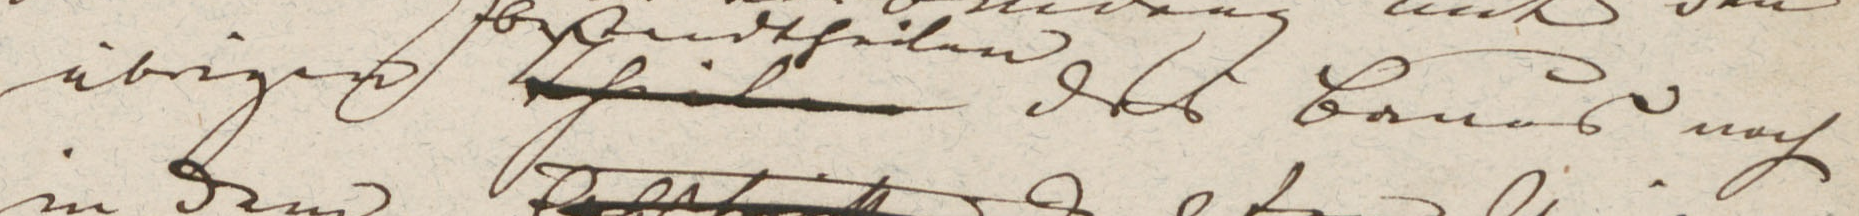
übrigen Theilen Bestandtheilen des Baues noch
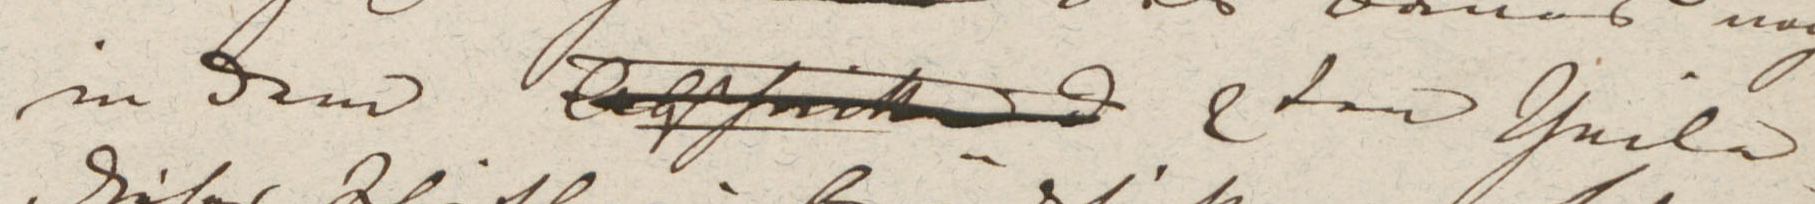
in dem Abschnitte d 2ten Theile
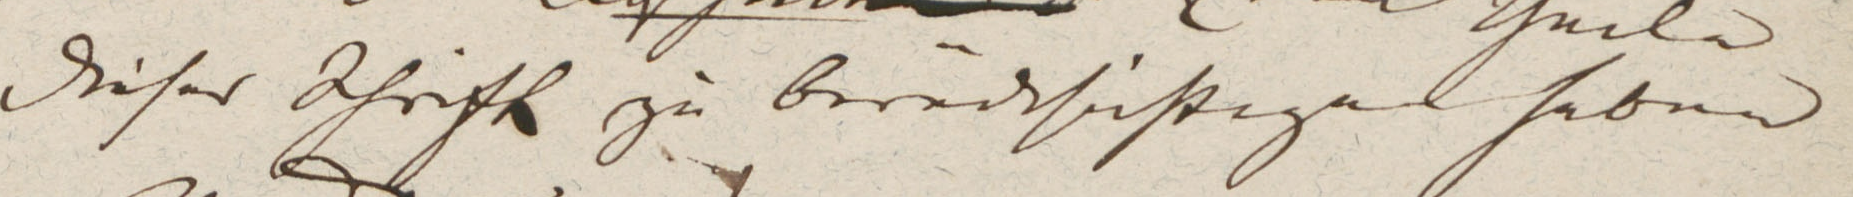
dieser Schrift zu berücksichtigen haben
